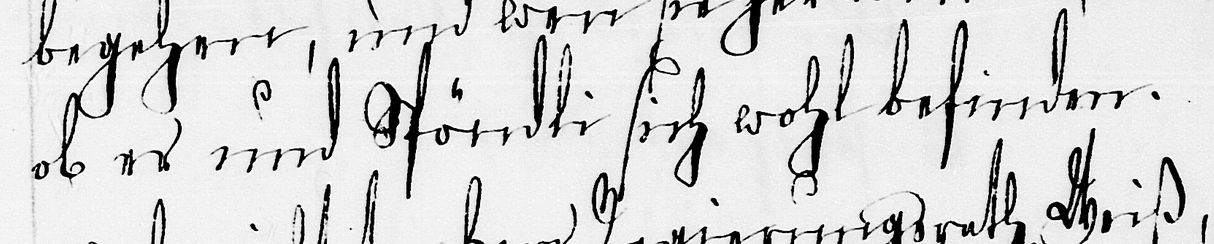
ob er und Spöndli sich wohl befinden.
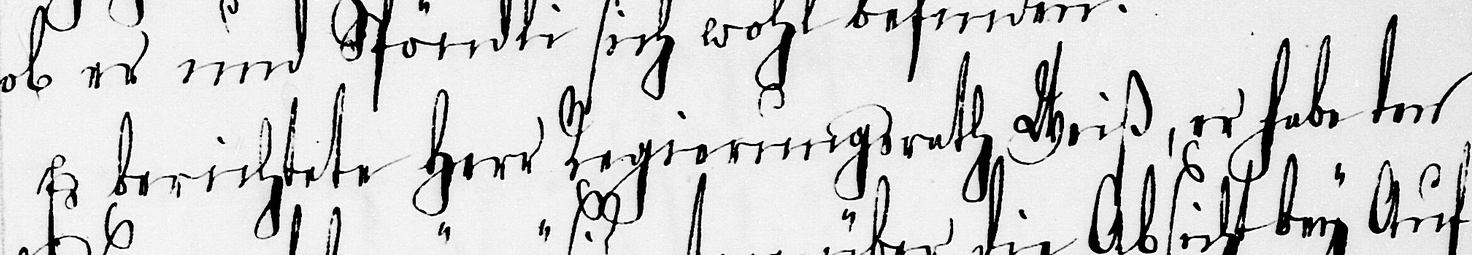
Es berichtete Herr Regierungsrath Weiß, er habe den
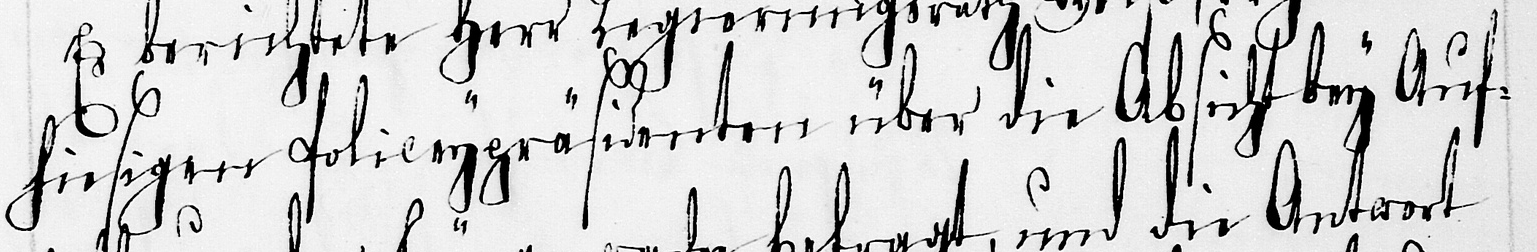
hiesigen Policeypräsidenten über die Absicht bey Aufs¬
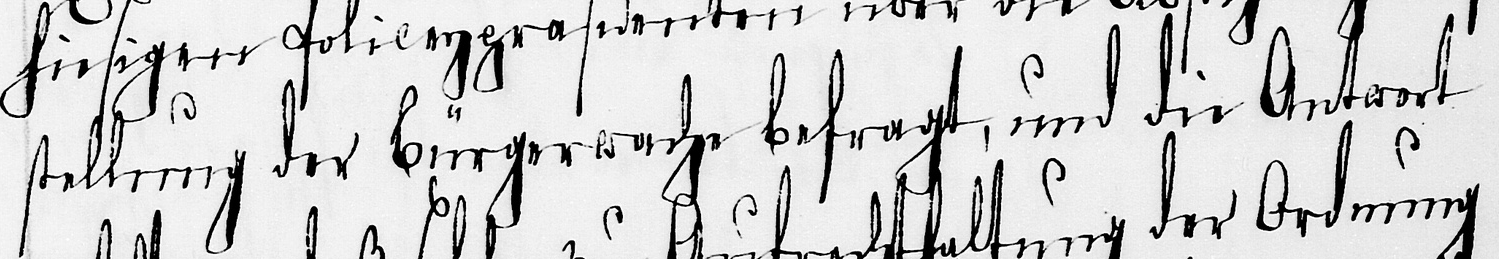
tellung der Bürgerwache befragt, und die Antwort
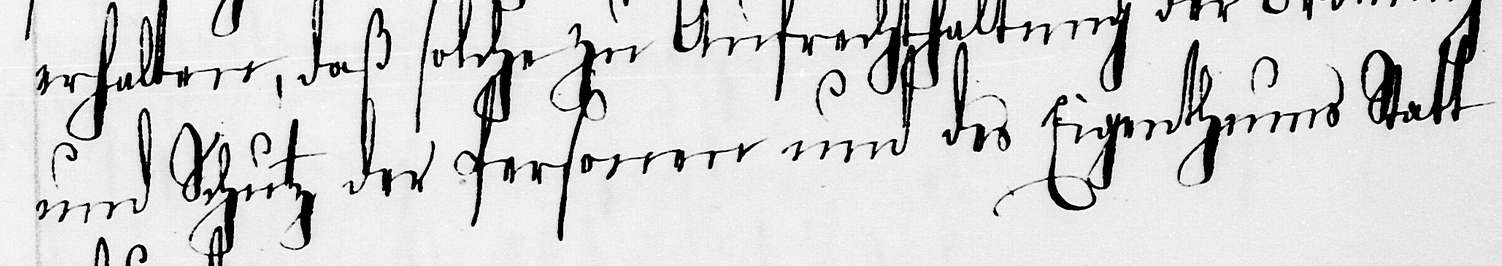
und Schutz der Personen und des Eigenthums Statt
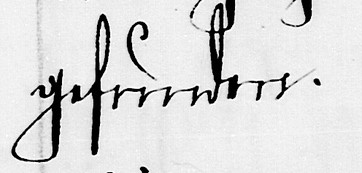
gefunden.
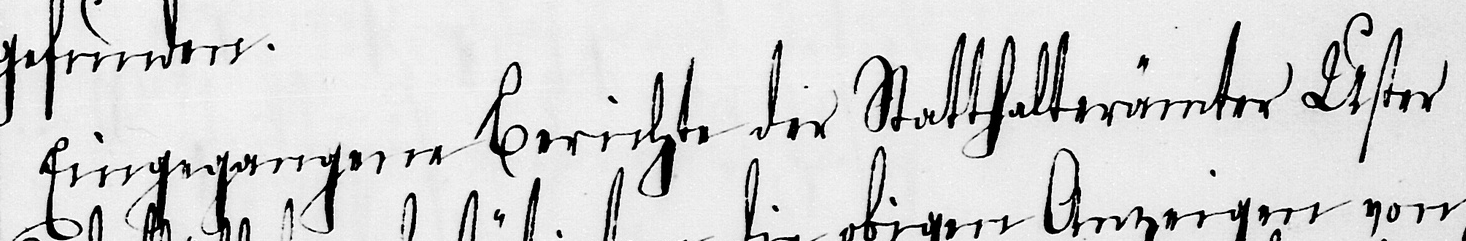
Eingegangene Berichte der Statthalterämter Uster
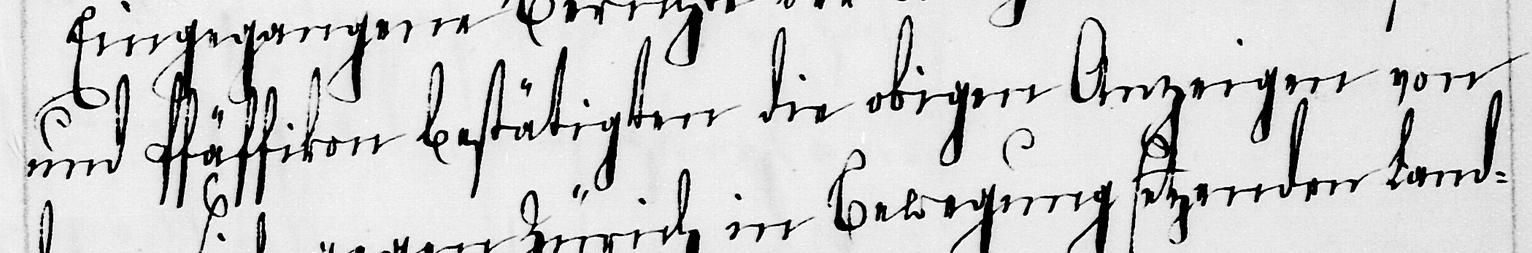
und Pfäffikon bestätigten die obigen Anzeigen von
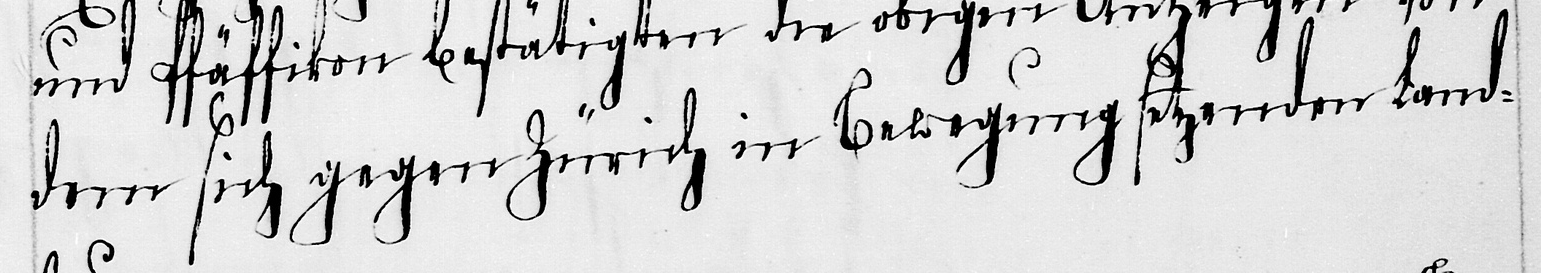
dem sich gegen Zürich in Bewegung setzenden Land¬
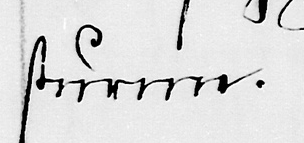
sturme.
